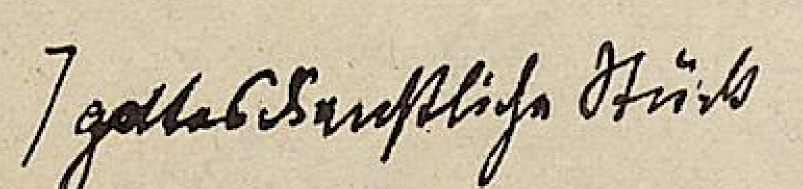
] gottesdienstliche Stück
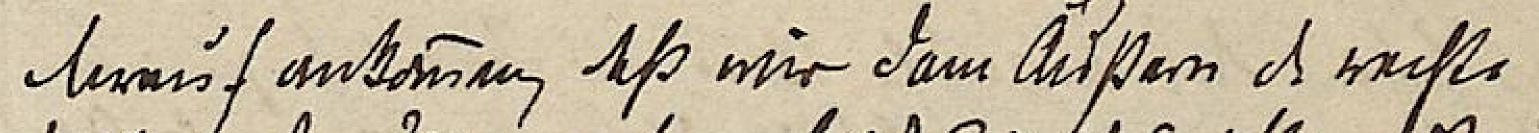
darauf ankomen, daß wir dem Äußern d. rechte
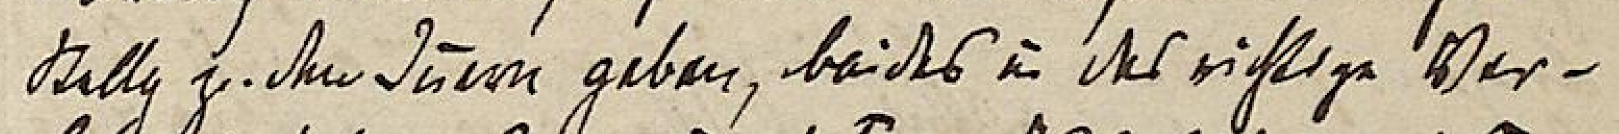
Stellg z. dem Inern geben, beides in das richtige Ver¬
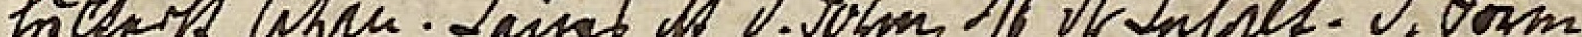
hätlniß setzen. Jenes ist d. Form, ds dr Inhalt; d. Form
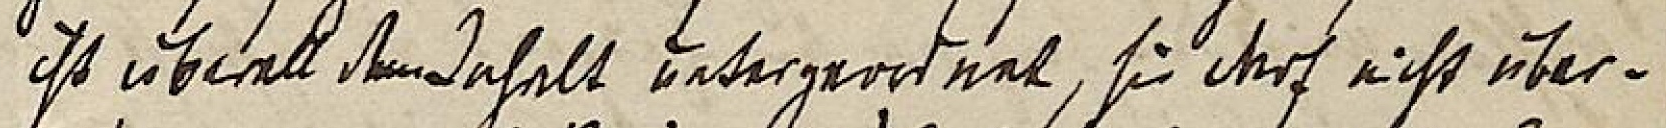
ist überall dem Inhalt untergeornet, sie darf nicht über¬
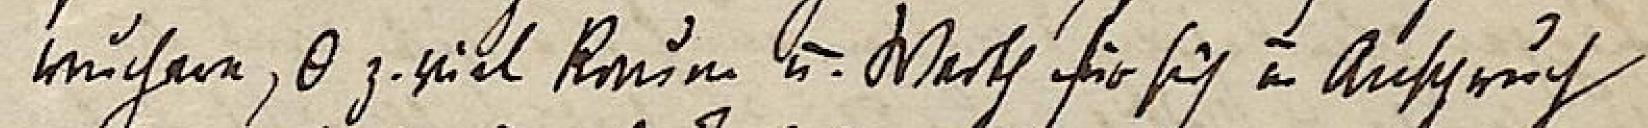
wuchern, o z. viel Raum u. Werth für sich in Anspruch
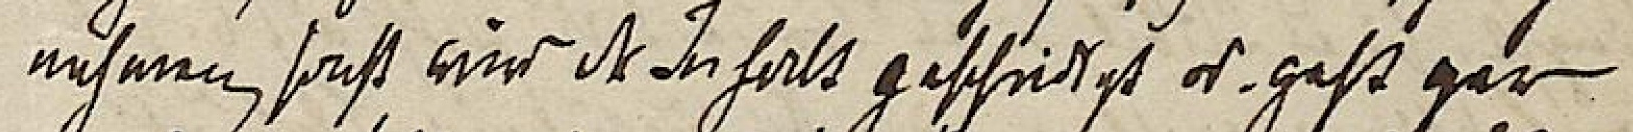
nehmen, sonst wird dr. Inhalt geschädigt od. geht gar
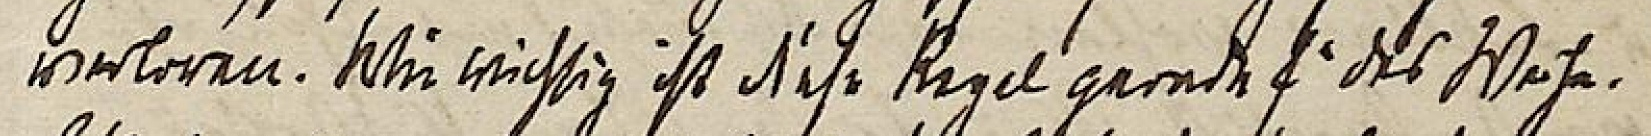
verlorgen. Wie wichtig ist diese Regel gerade fü das Weihn.¬
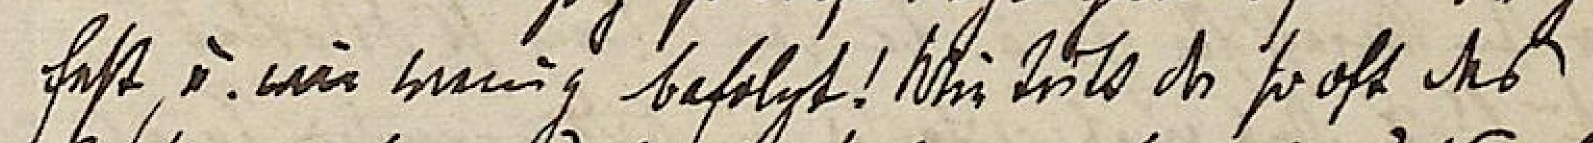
fest, u. wie wenig befolgt! Wie tritt da sooft das
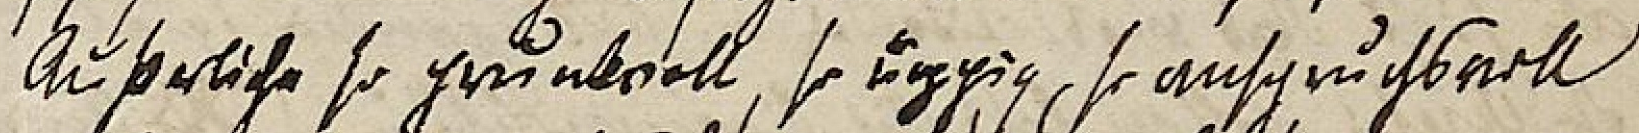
Äußerliche so prunkvoll, so üppig, so anspruchsvoll
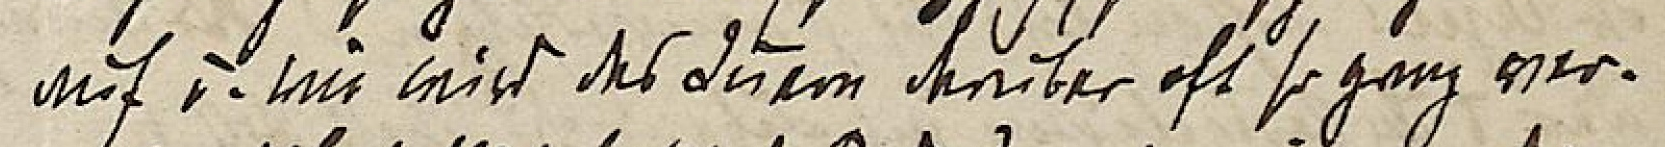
auf u. wie wird das Inere darüber oft so ganz ver¬
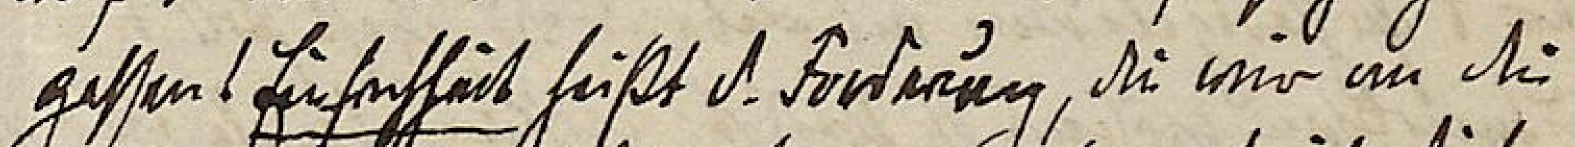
gessen! Einfachheit heißt d. Forderung, die wir an die
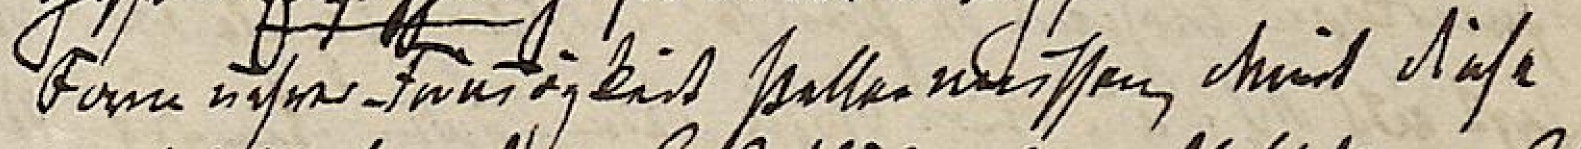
Form unsrer Frömigkeit stellen müssen, damit diese
